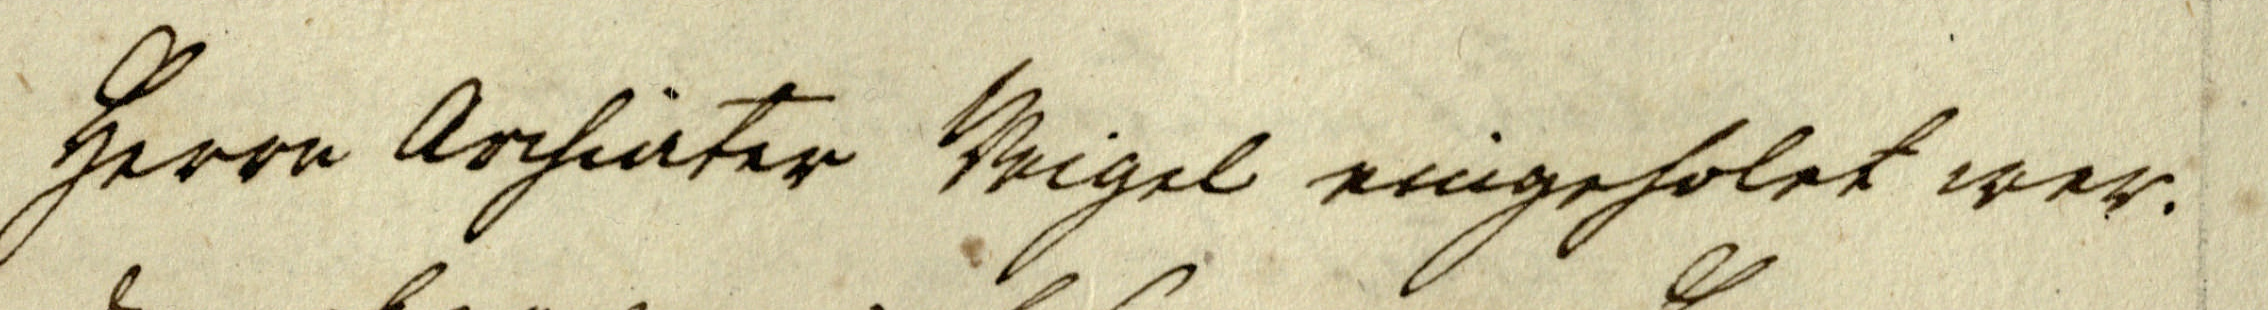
Herrn Archiater Weigel eingeholet wer¬
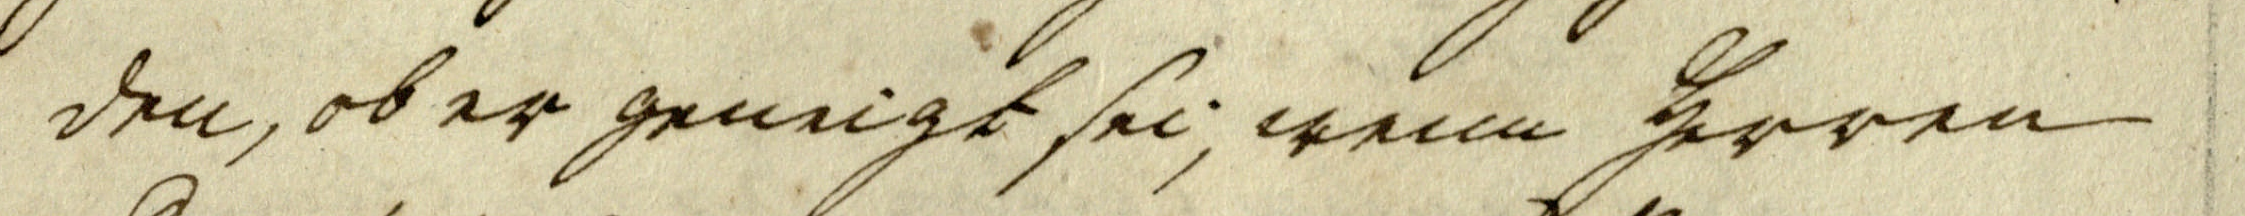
den, ob er geneigt sei, wenn Herren
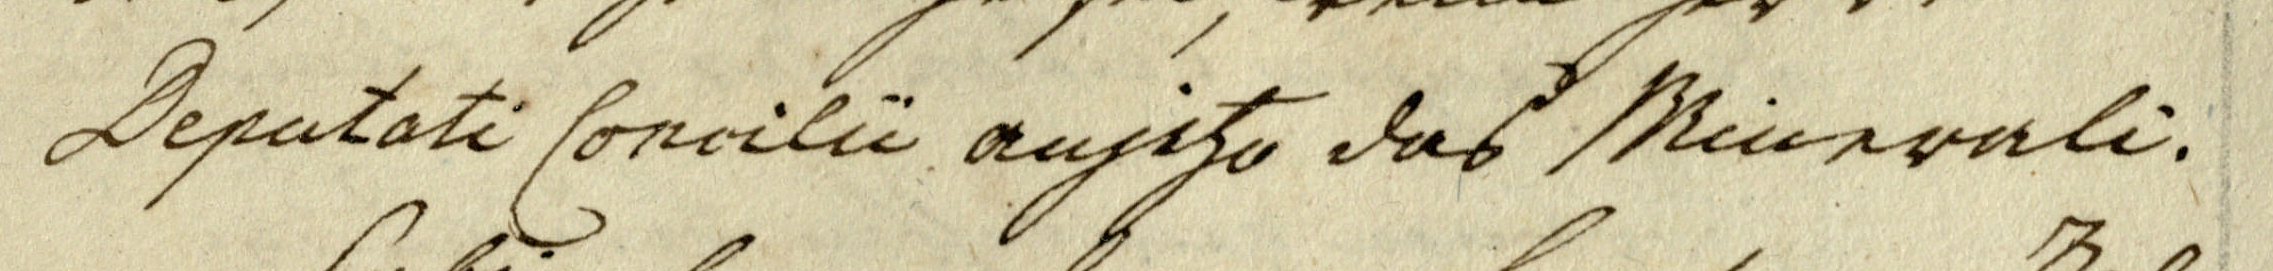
Deputati Concilii anjetzo das Minerali¬
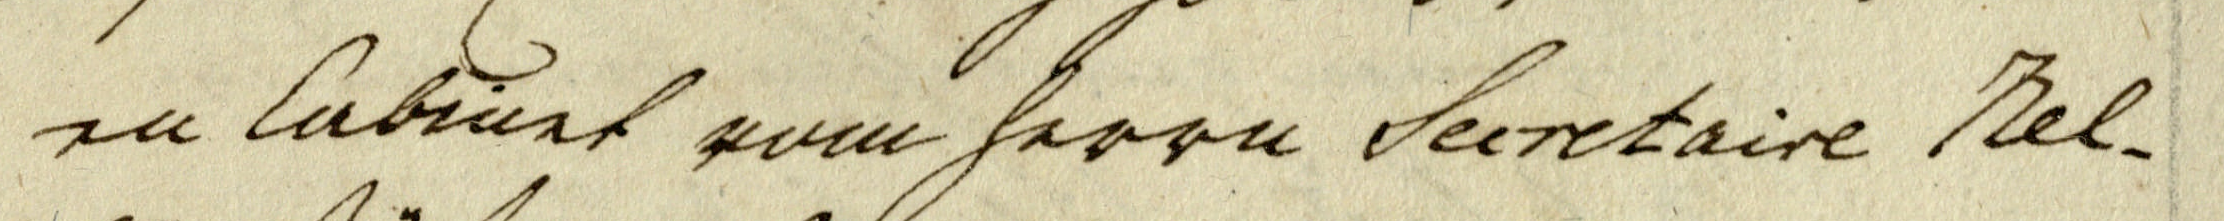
ein Cabinet vom Herrn Secretaire Nel¬
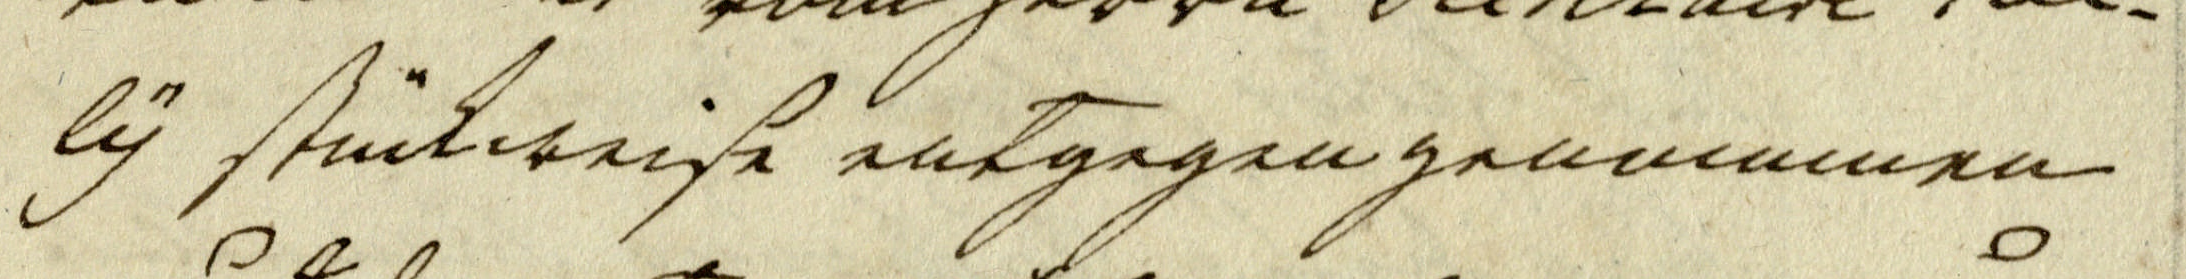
lÿ stückweise entgegen genommen
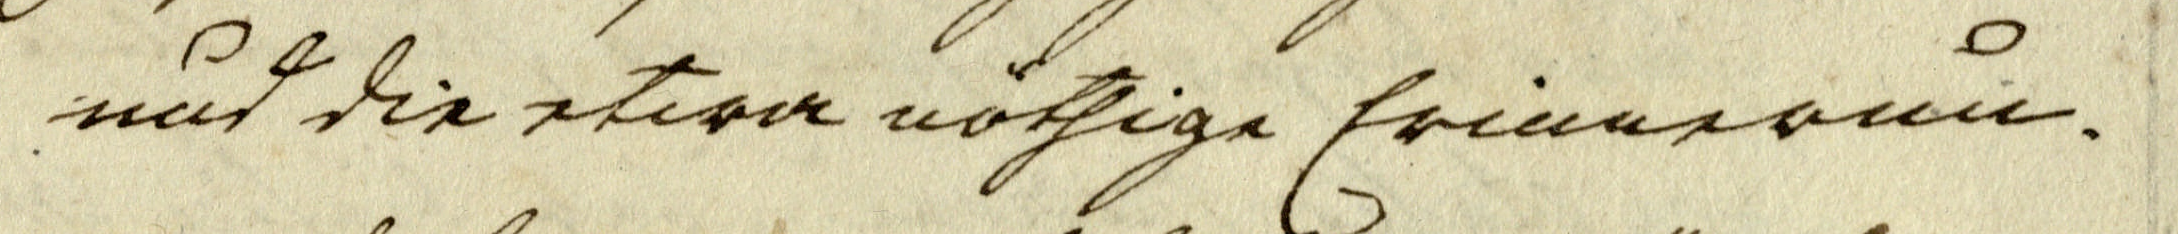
und die etwa nöthige Erinnerun¬
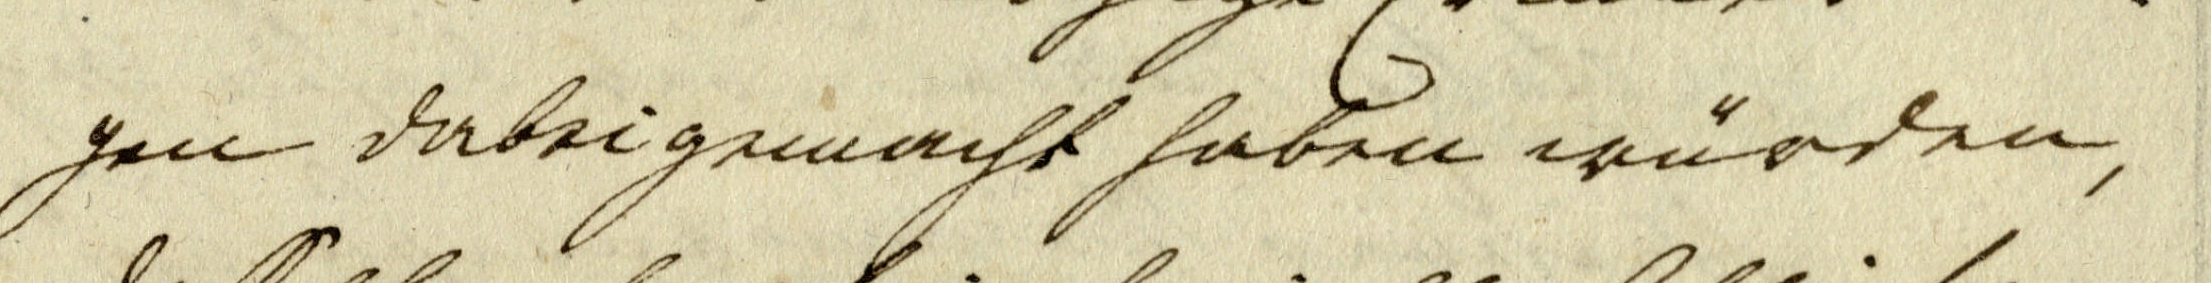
gen dabeigemacht haben würden,
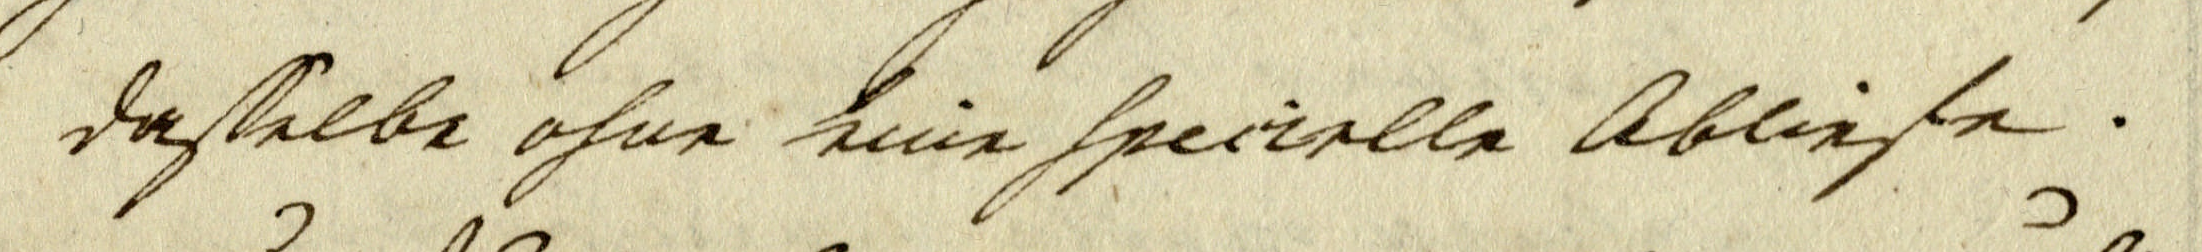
dasselbe ohne eine specielle Abliefe¬
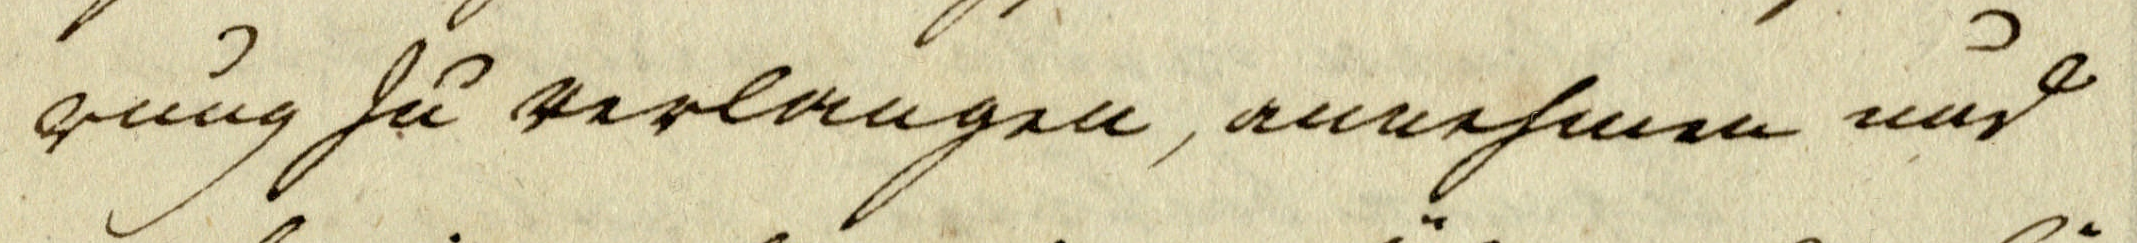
rung zu verlangen, annehmen und
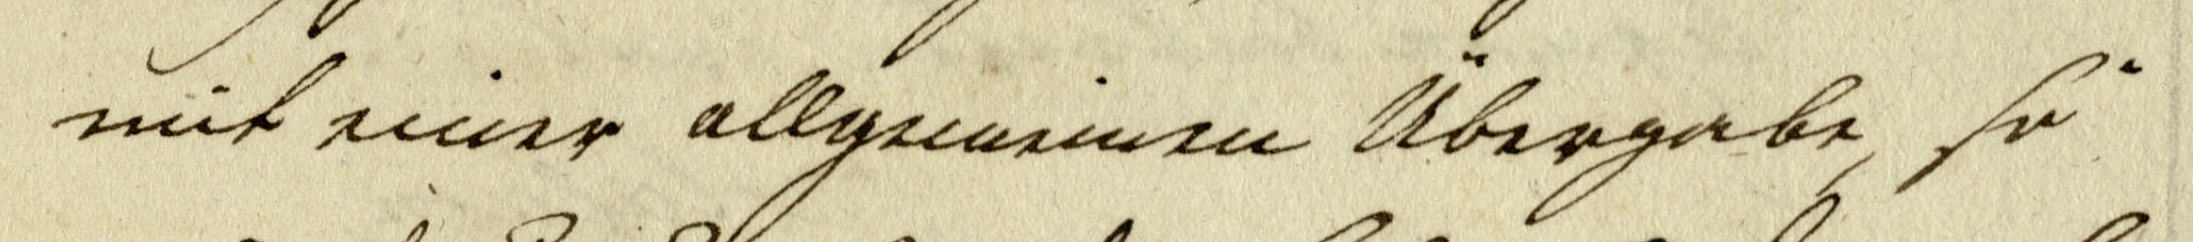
mit einer allgemeinen Übergabe, so
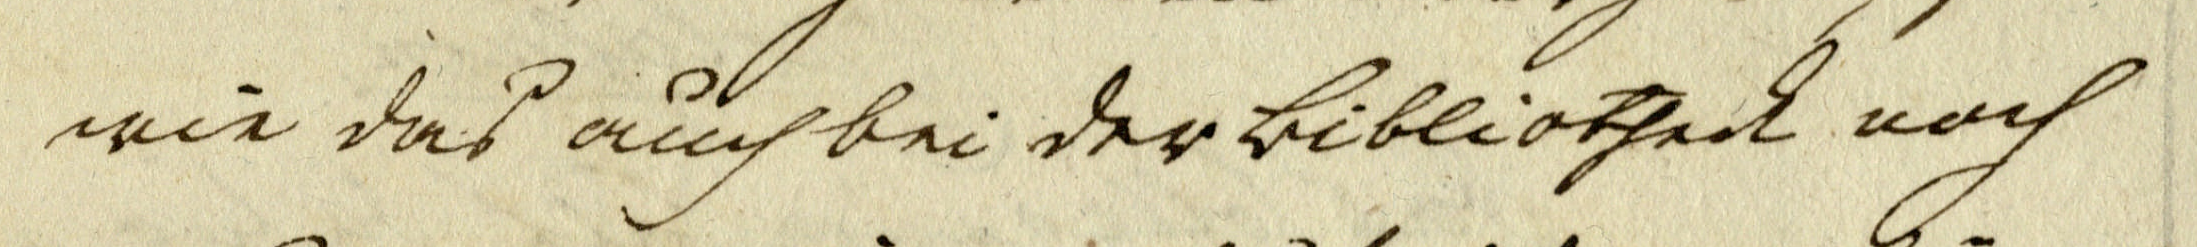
wie das auch bei der Bibliotheck noch
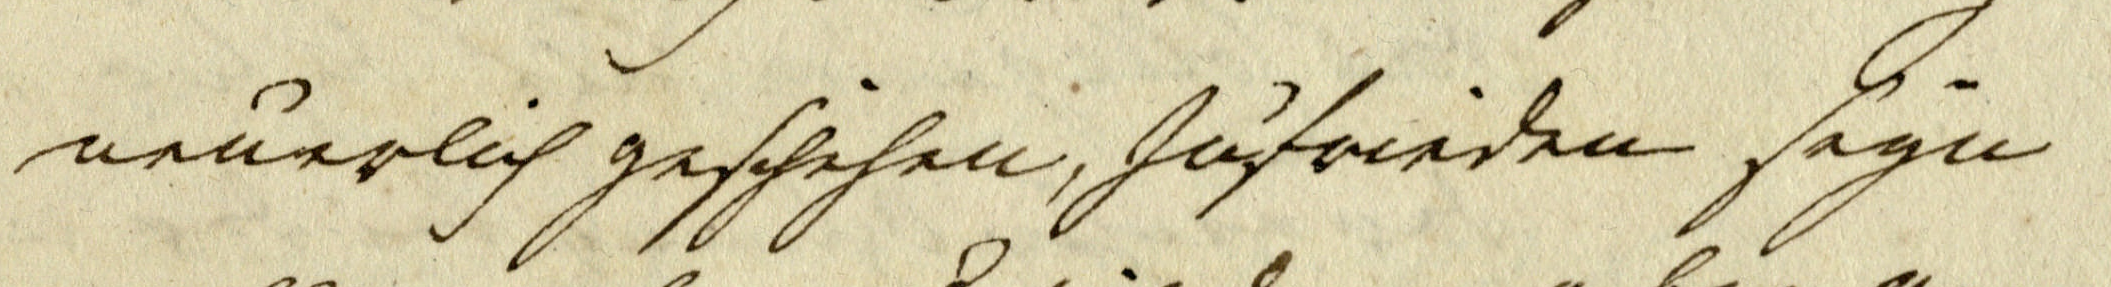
neuerlich geschehen, zufrieden seÿn
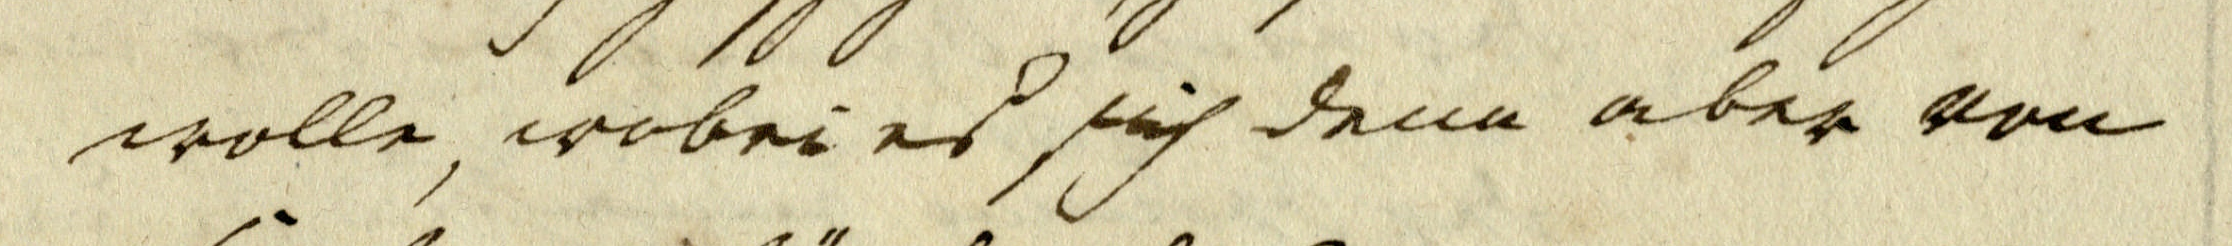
wolle, wobei es sich denn aber von
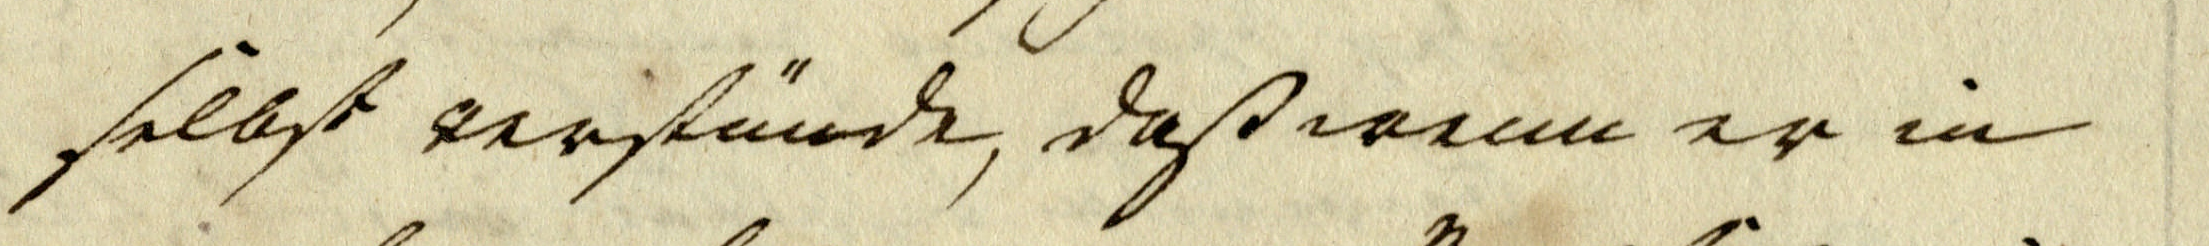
selbst verstünde, daß wenn er in
